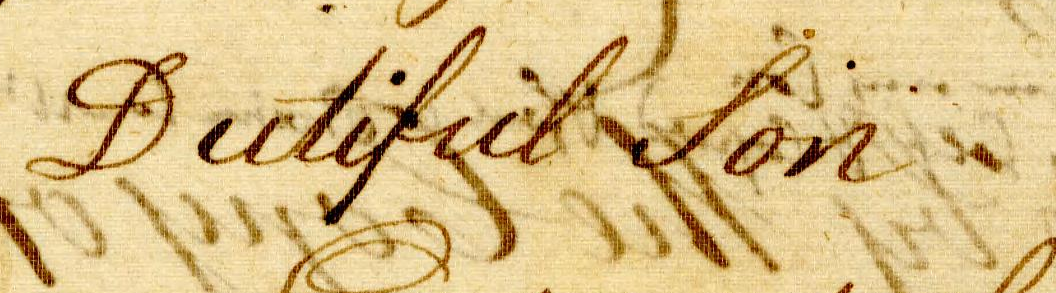Dutiful Son
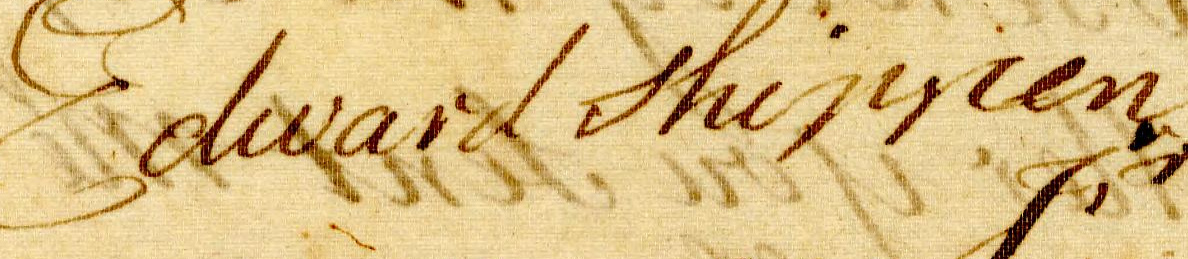Edward Shippen
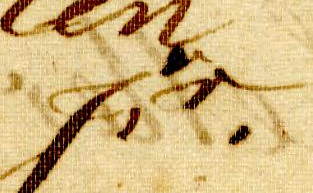J.^r.
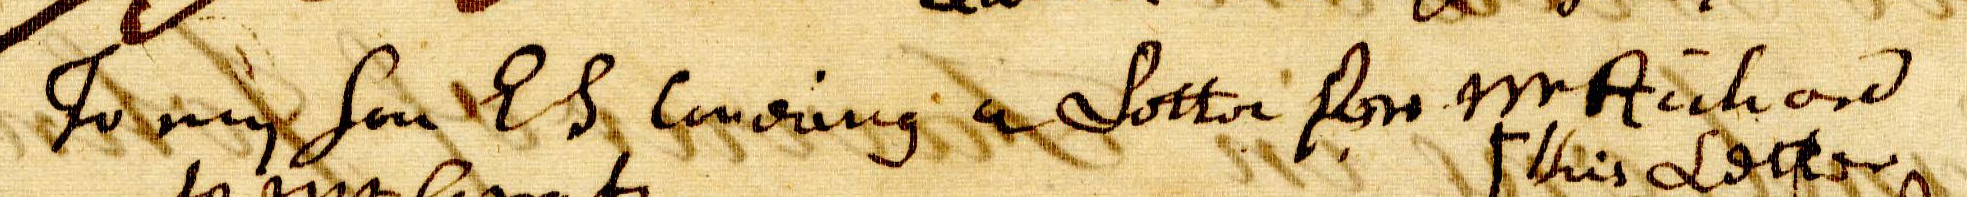To my son ES Concerning a Letter from M^r Richard
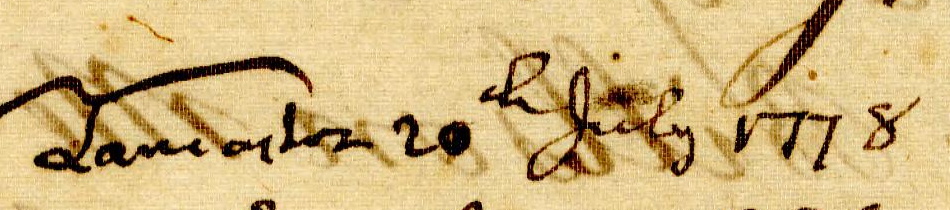Lancaster 20^th July 1778
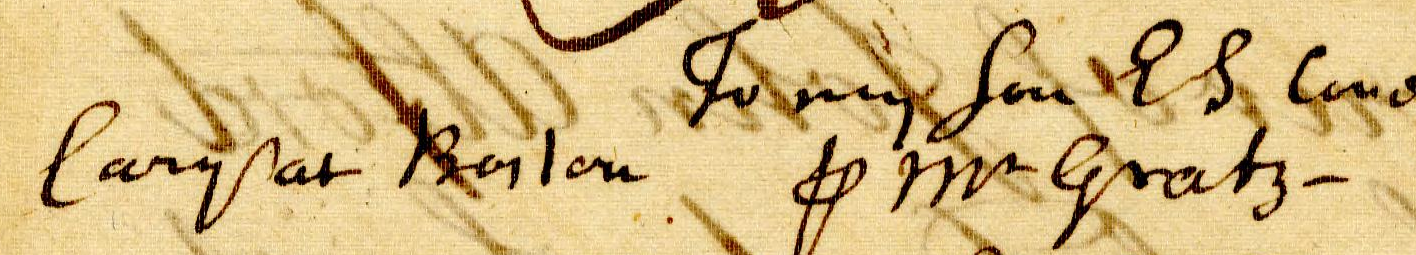Cary at Boston, per M^r Gratz-
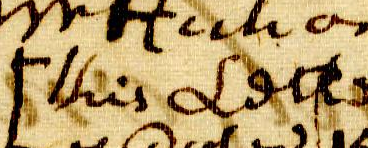[this Letter
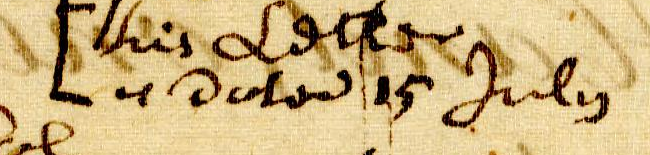is dated 15 July
